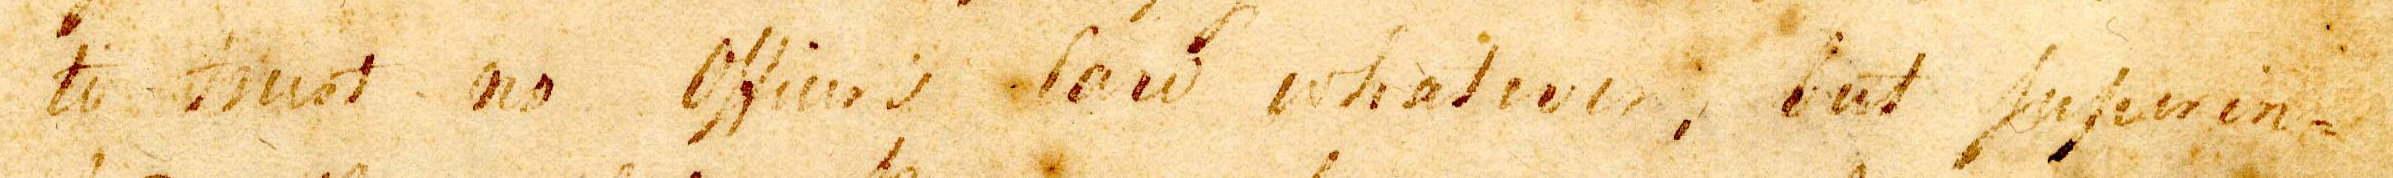to trust no Officer's law whatever, but Superin-
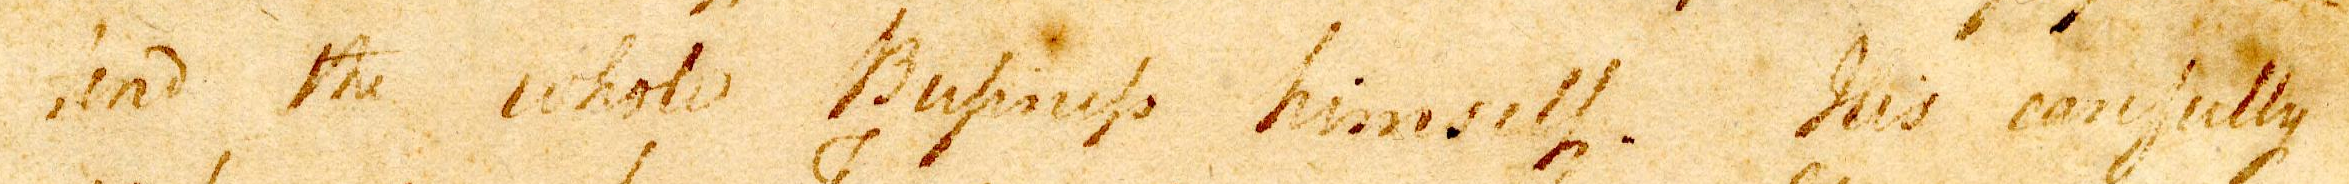-tend the whole Business himself. It is carefully
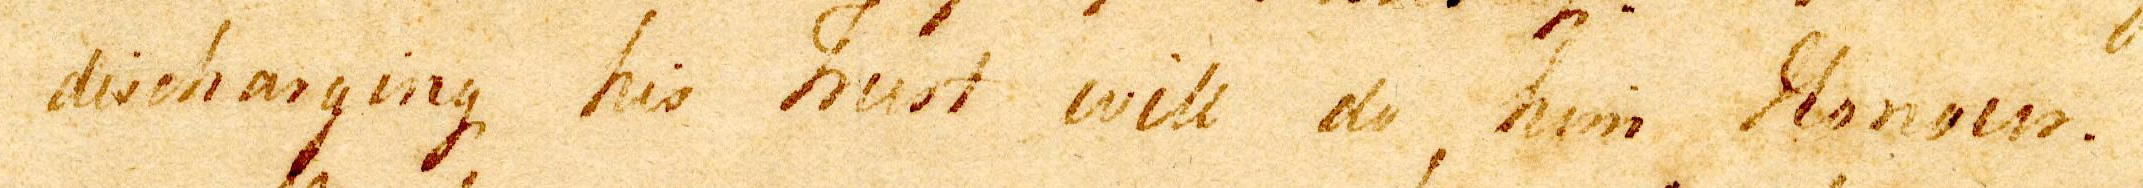discharging his Trust will do him Honour.
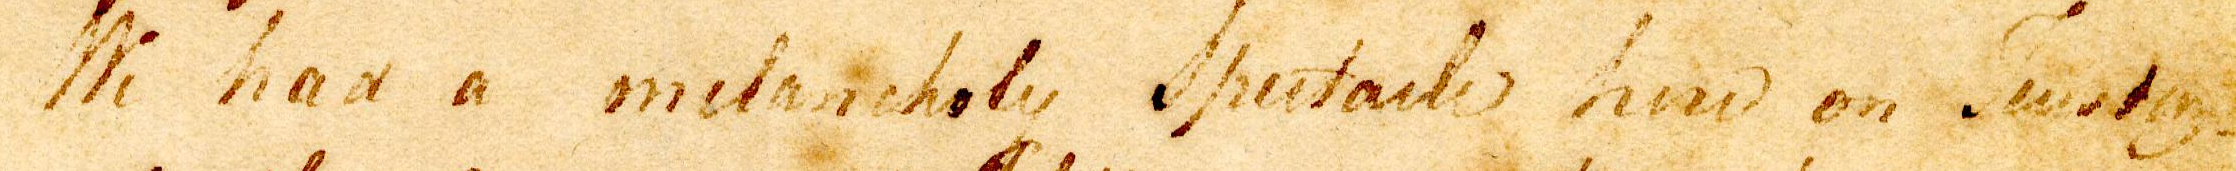We had a melancholy Spectacle here on Tuesday
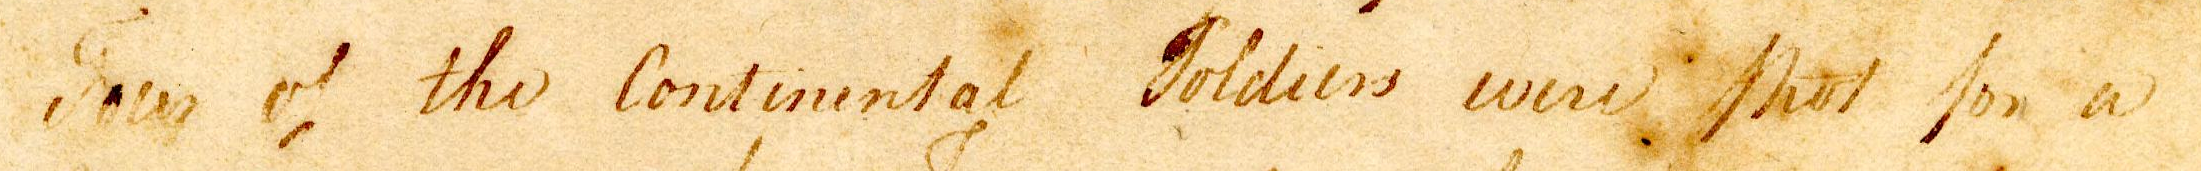Four of the Continental Soldiers were shot for a
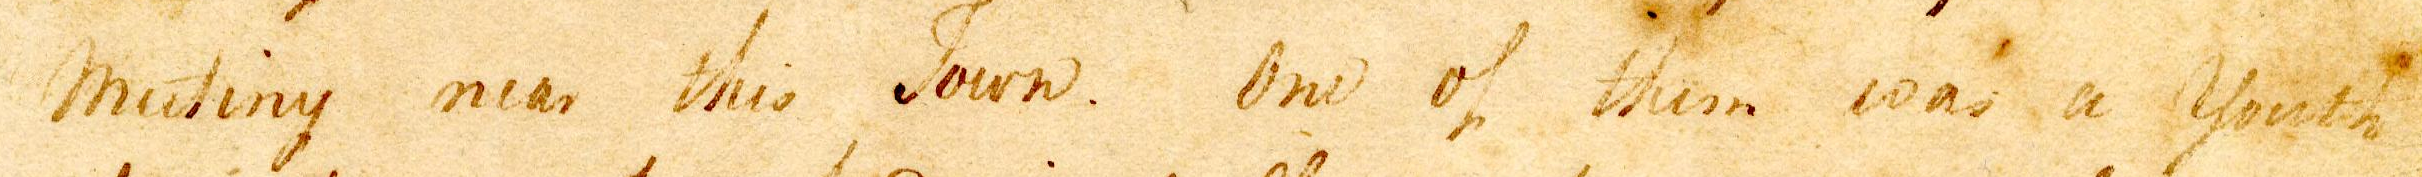Meeting near this Town. One of them was a Youth
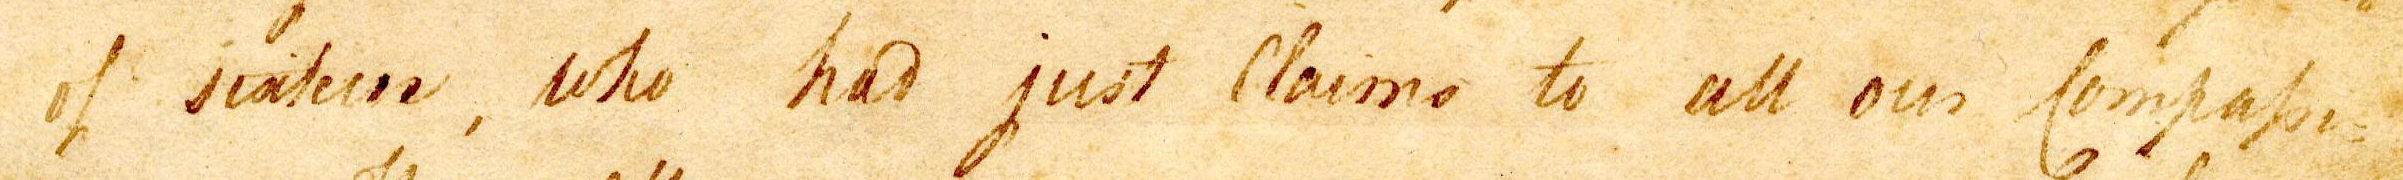of sixteen who had just Claims to all our Compass
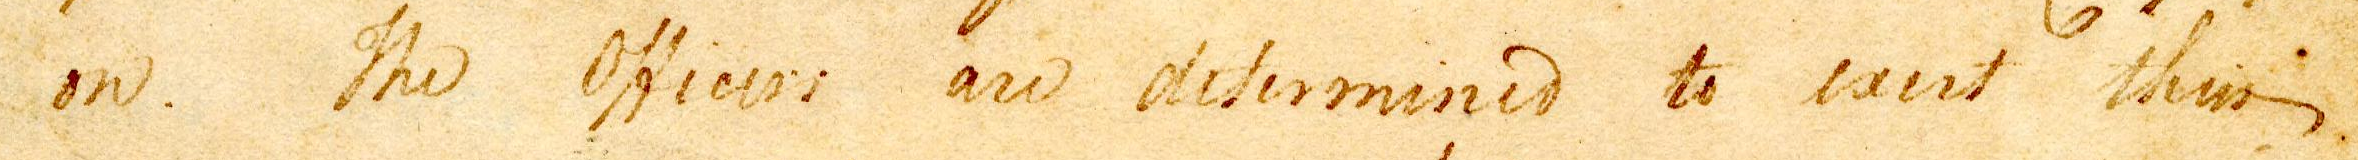on The Officers are determined to exert their
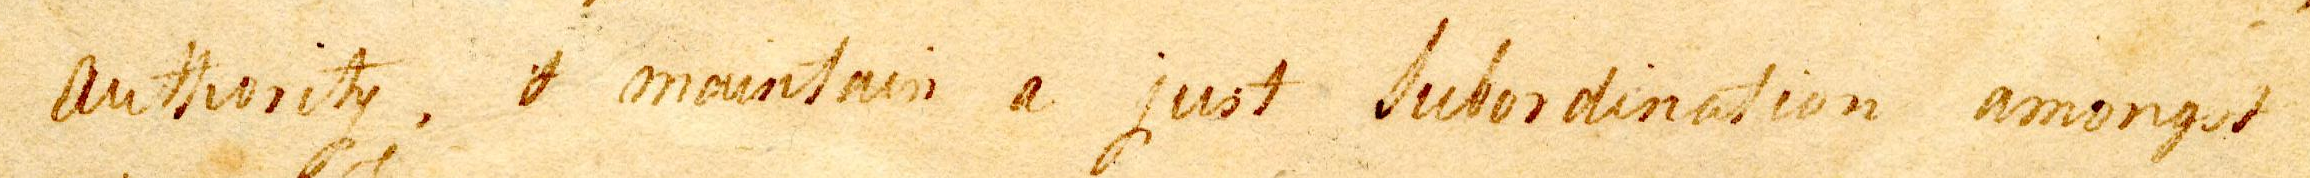Authority, & maintain a just subordination amongst
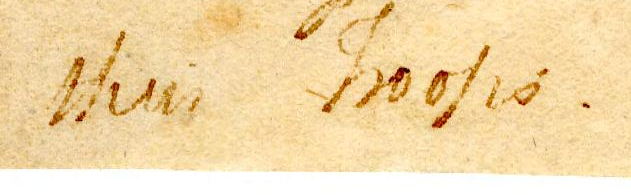their Troops.
